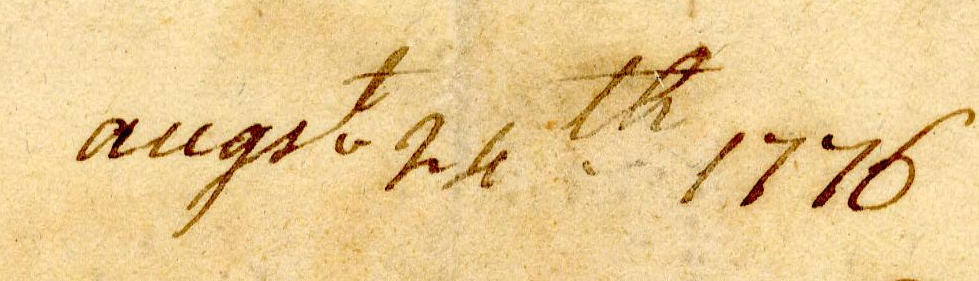augs^t. 24^th. 1776
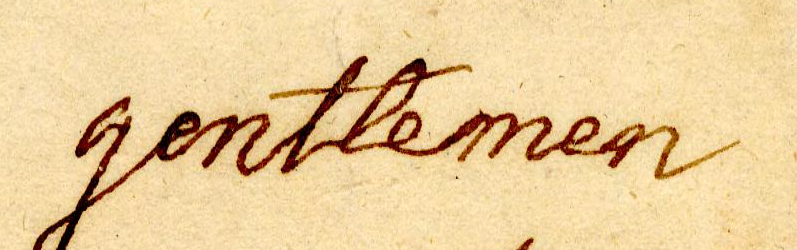gentlemen
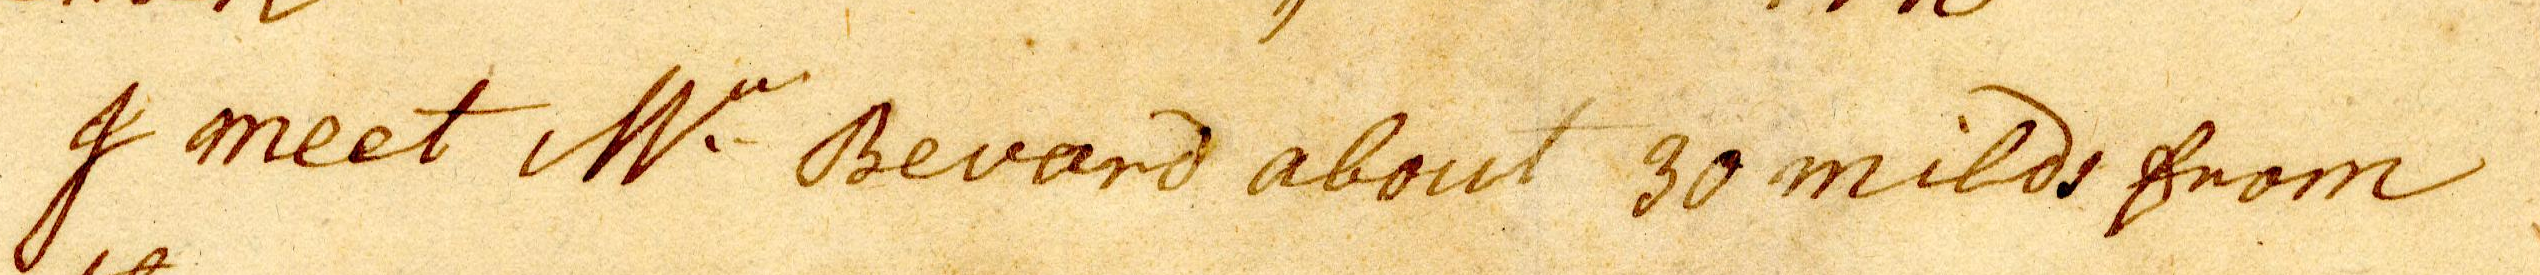I meet M^r Bevard about 30 milds from
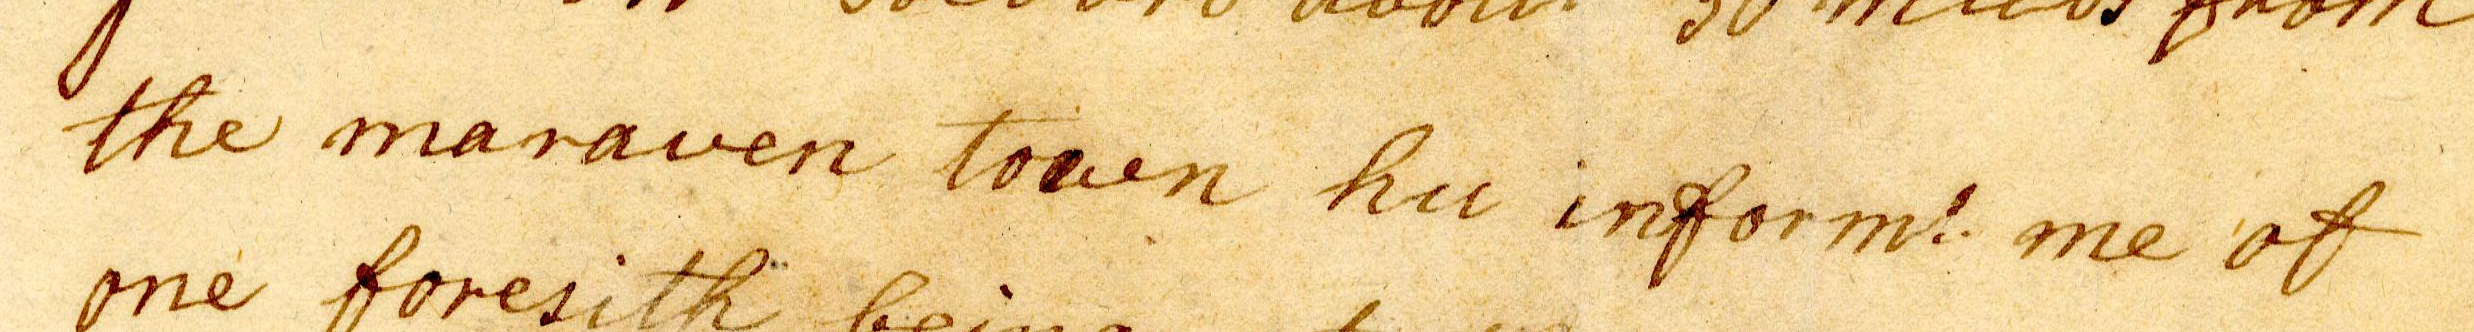the maraven town he inform^s me of
